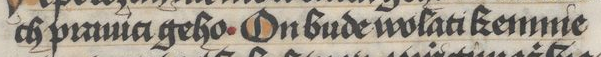ch prauici geho.On bude wolati kemnie
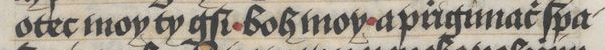otec moy ty gſi.boh moy.a pṙigimaċ ſpa¬
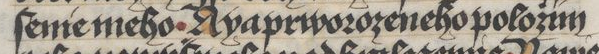ſeníe meho.Aya prworozeneho polożím
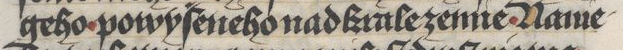geho.powýẛeneho nad krale zemie.Nauie¬
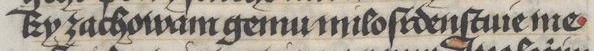ky zachowam gemu miloſrdenſtuíe me.
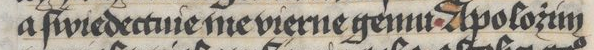a ſwiedectuie me vierne gemu.Apolożím
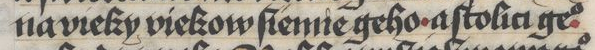na vieky viekow ſiemie geho.a ſtolici geo
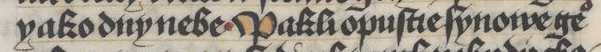yako dny nebe.Pakli opuſtie ſynowé geo
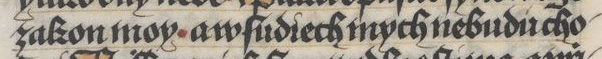zakon moy. a wſudiech mych nebudu cho¬
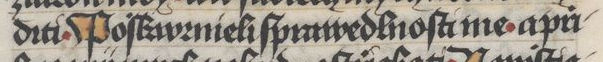diti.Poẛkwrnieli ſprawedlnoſti me.a pṙi¬
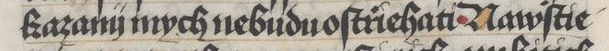kazanij mych nebudu oſtṙiehati.Nawẛtie¬
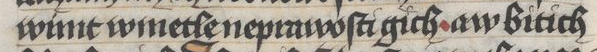winit wmetle neprawoſti gich.aw bitích
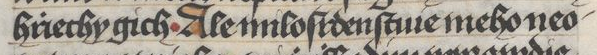hṙiechy gich.Ale miloſrdenſtuie meho neo¬
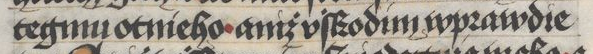tegmu otnieho.aniż vẛkodim wprawdie
